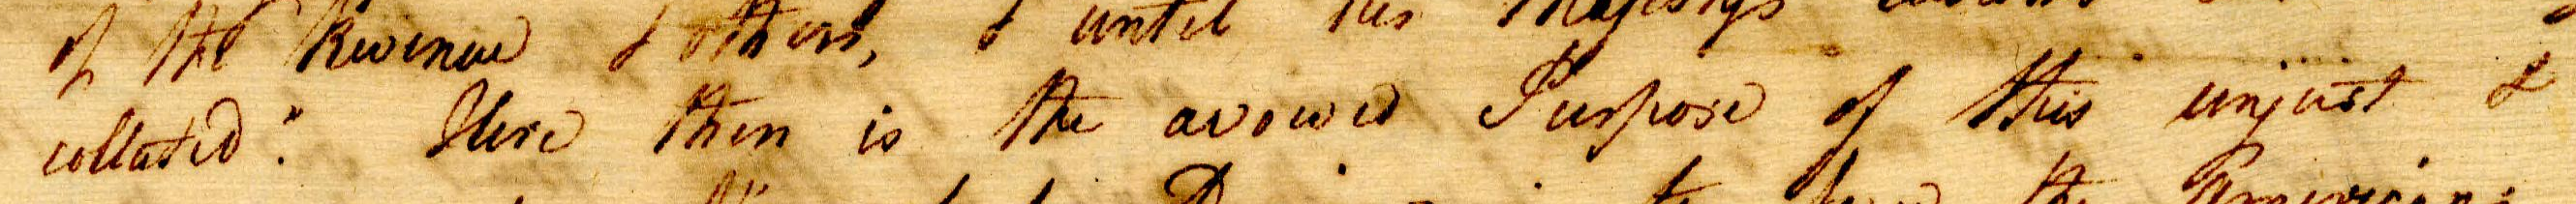collated. Here then is the avowed Purpose of this unjust &
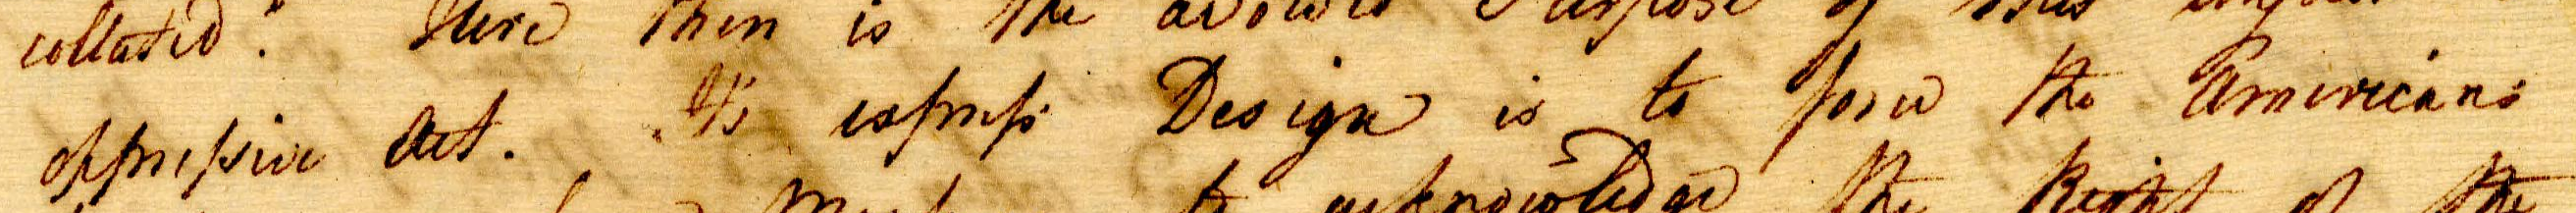oppressive Act. It's express Design is to force the Americans
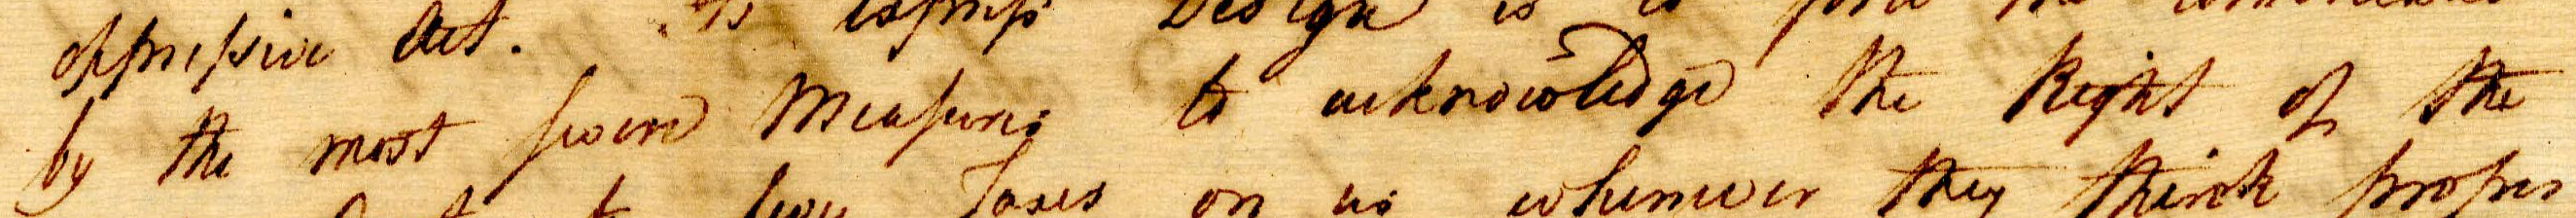by the most sworn Measure, to acknowledge the Right of the
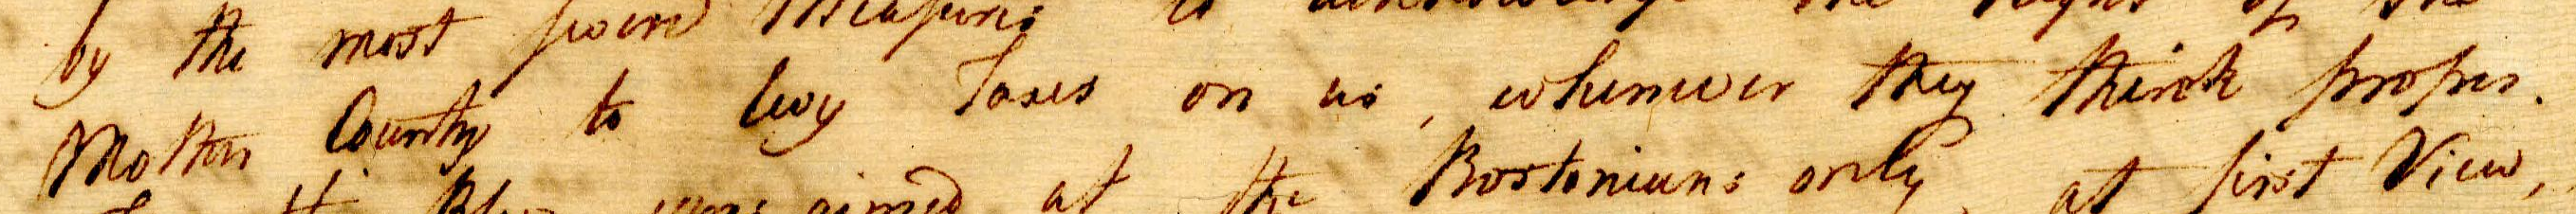Mother Country to levy Taxes on us, whenever they think proper.
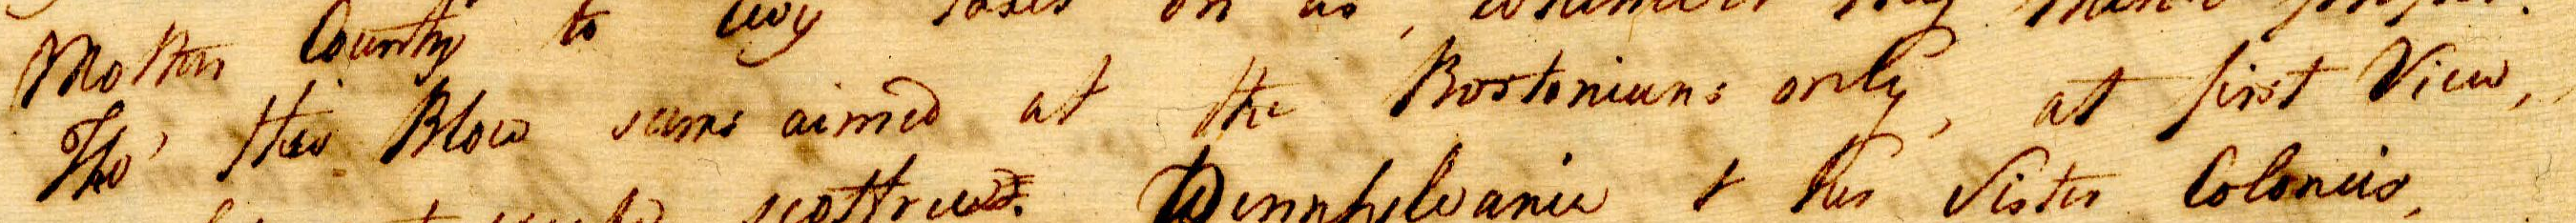Tho' this Blow seems aimed at the Bostonians only at first View,
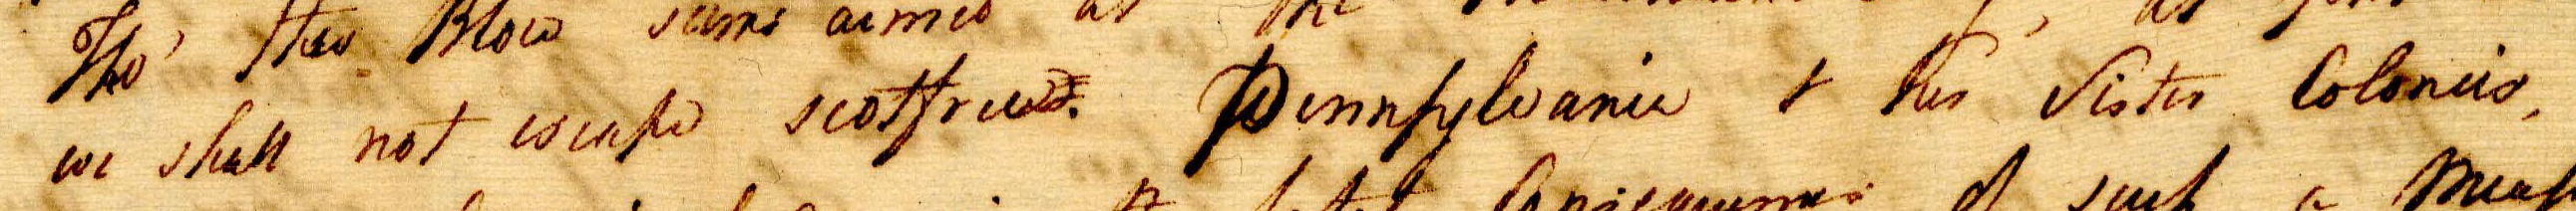we shall not escape scotfreed. Pennsylvania & her Sister Colonies
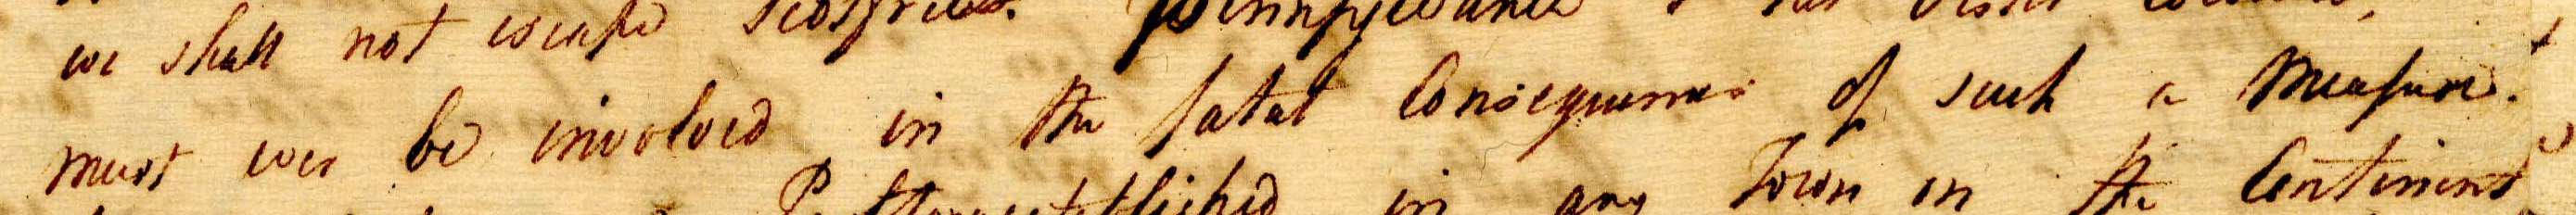must ever be involved in the fatal Consequence of such a Measure.
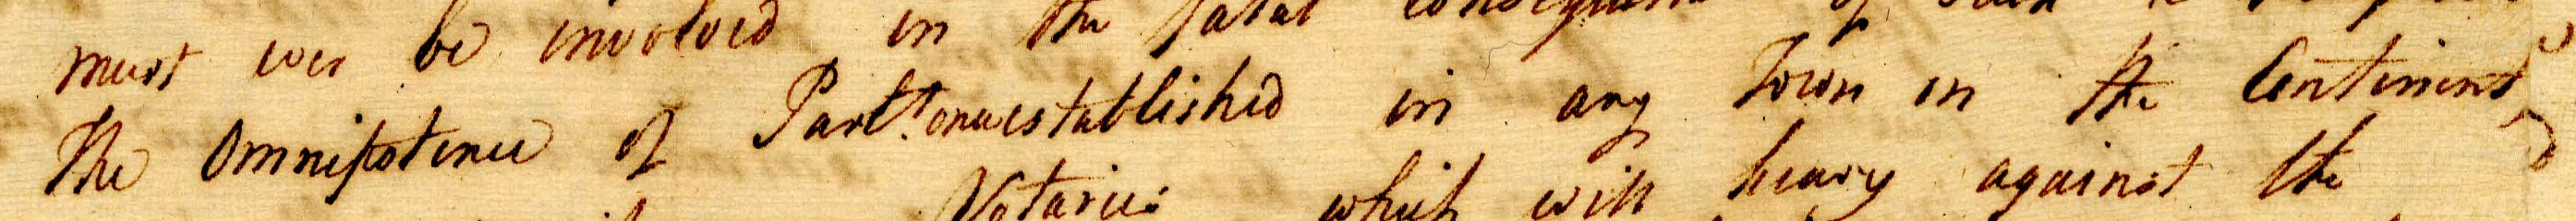The Omnipotence of Parl^t once established in any Town in the Continent
